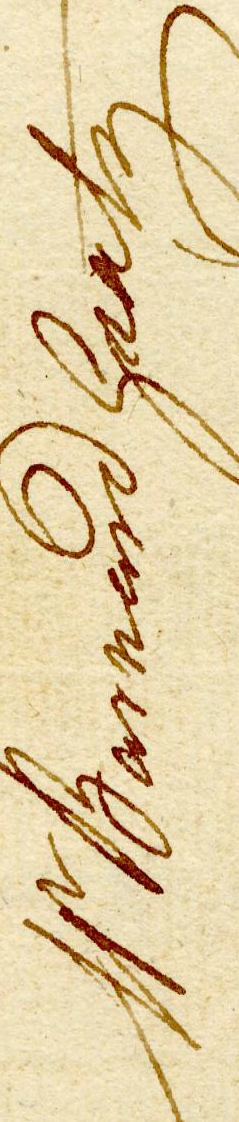M^r Barnard Gratz
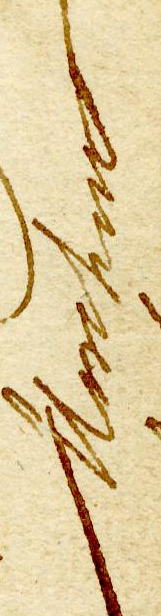Merchant
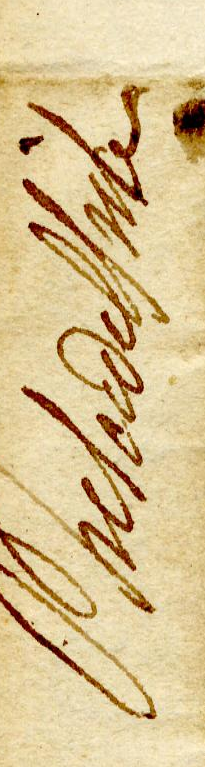Philadelphia
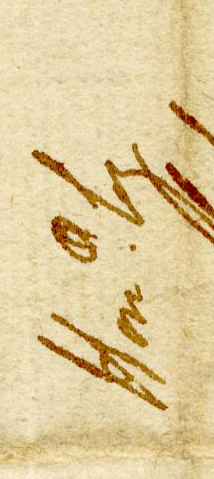Hon^d. by
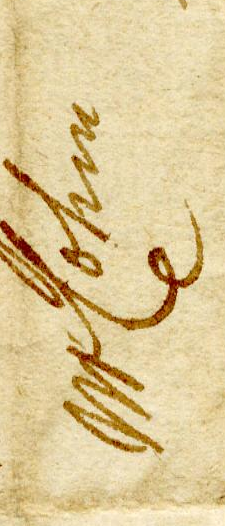M^r Cohen
